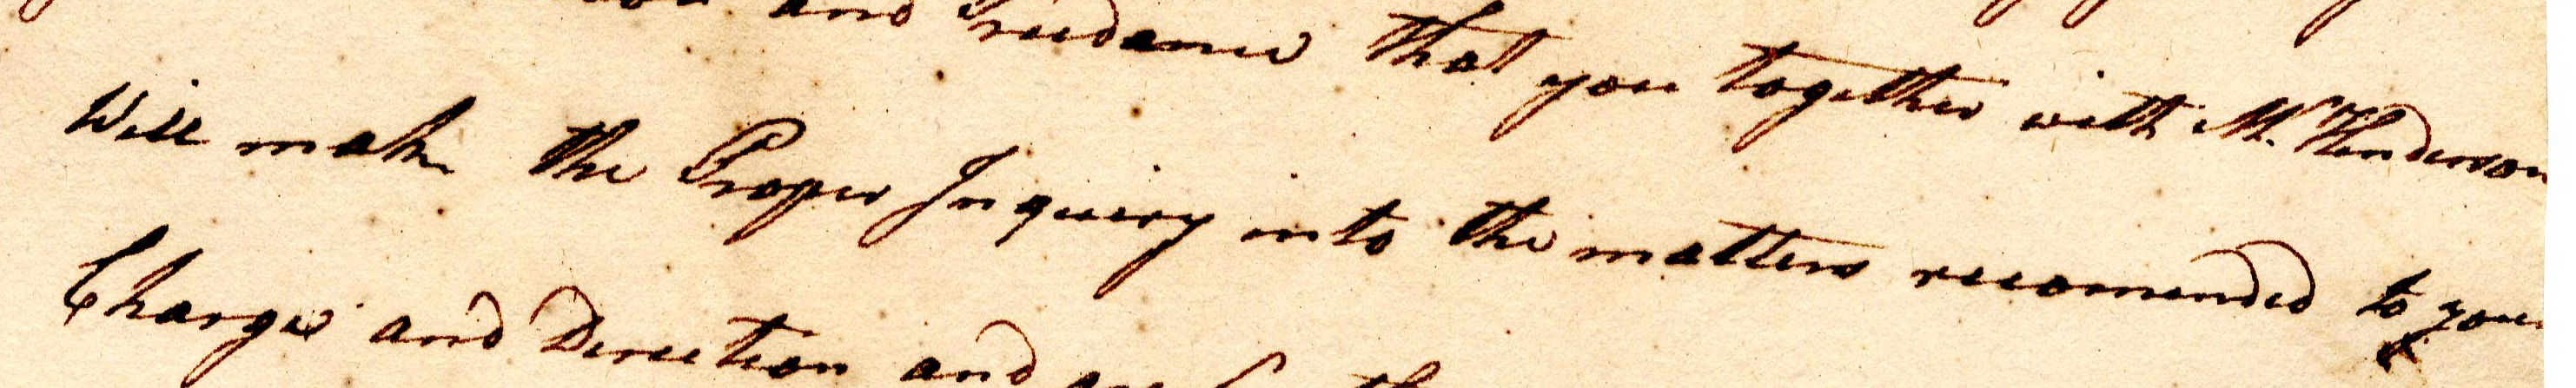will make the Proper Inquiry into the matters recomended to your
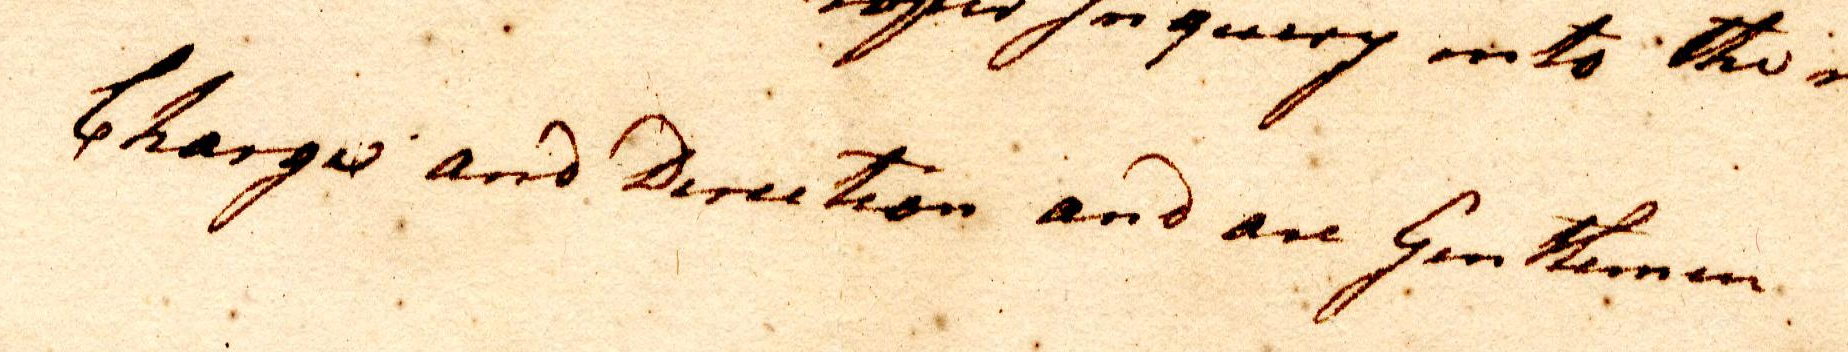Charge and Direction and are Gentlemen
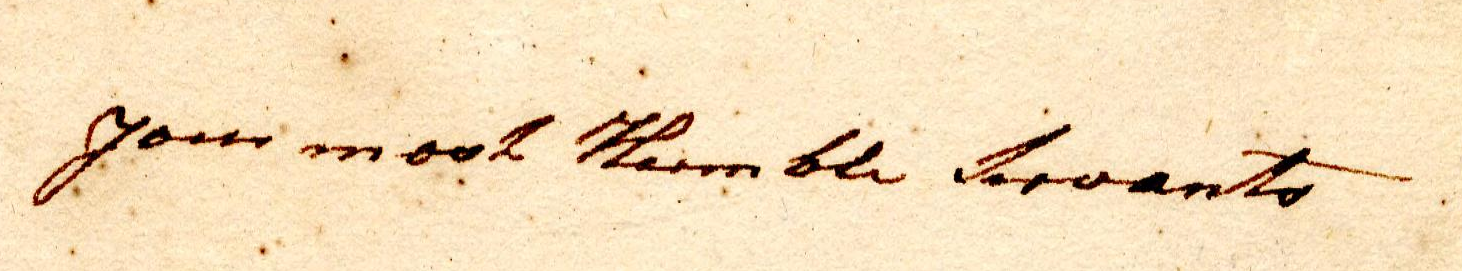Your most Humble Servants
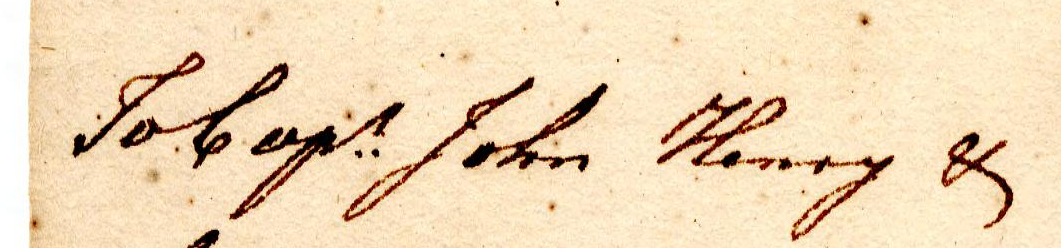To Cap^t. John Henry &
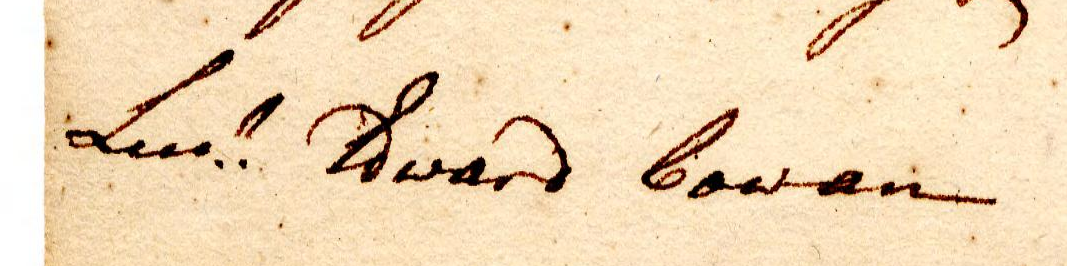Lieu^t. Edward Cowan
